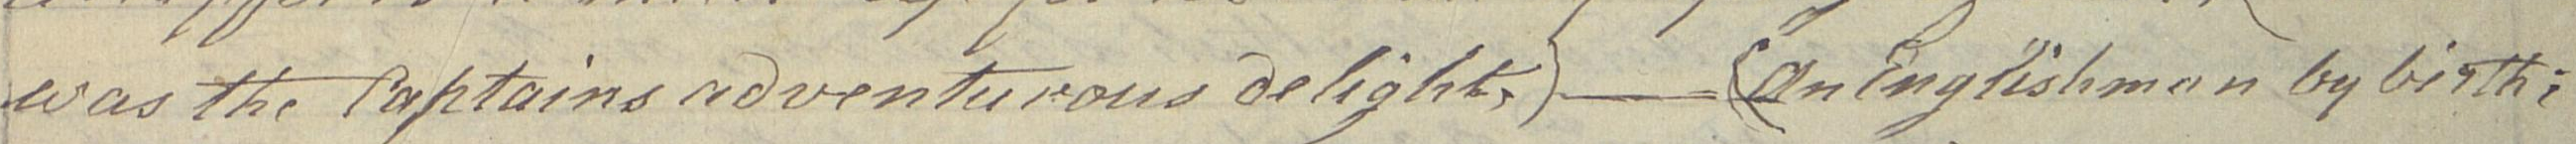was the Captains adventurous delight,) (An Englishman by birth;
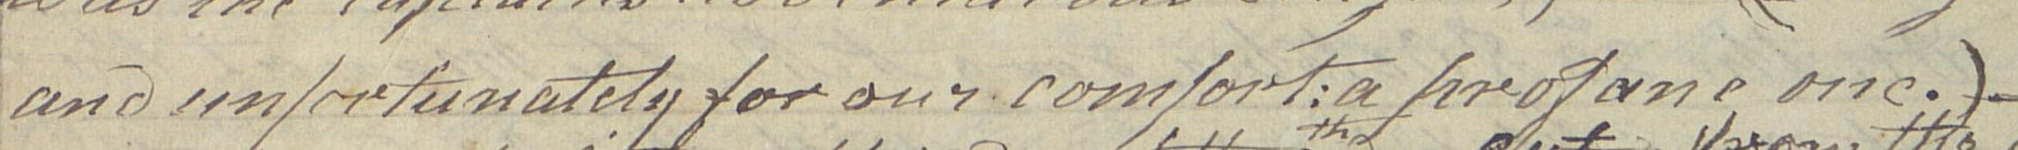and unfortunately for our comfort: a profane one.)
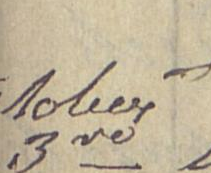-tober
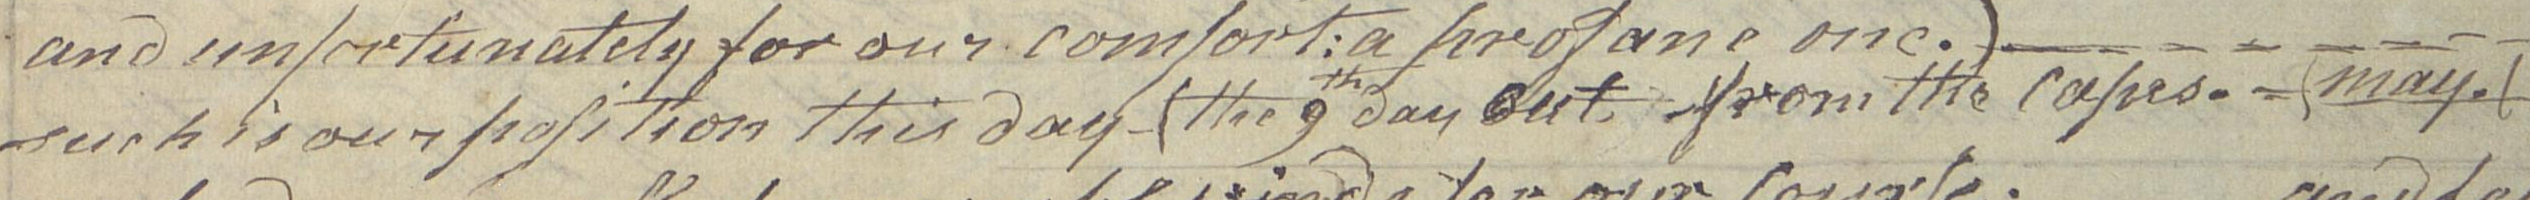such is our position this day (the 9^th day Out from the capes. (May. 1
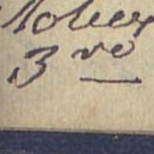3^rd
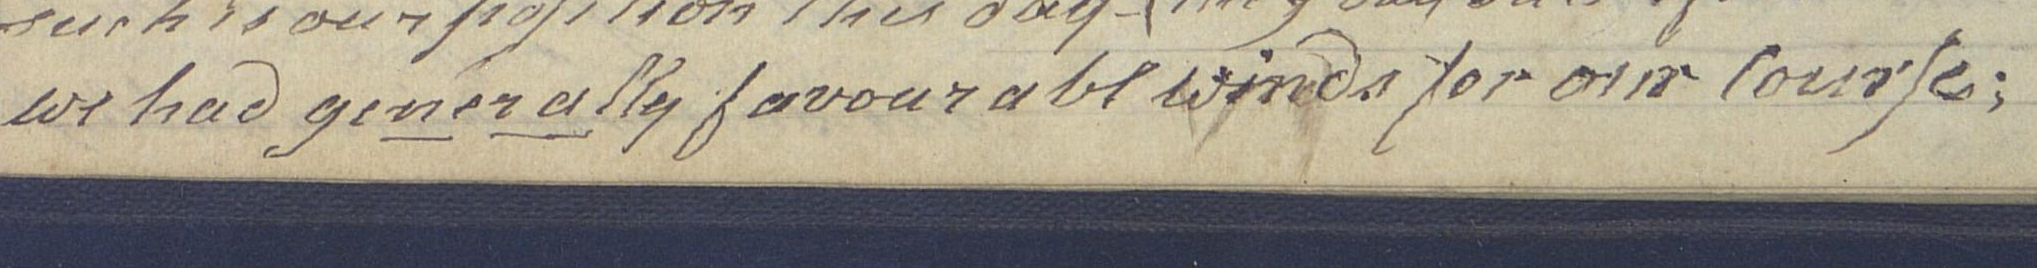we had generally favourable winds for our Course;
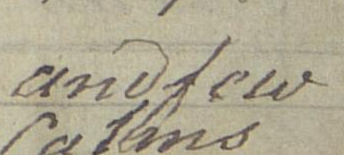and few
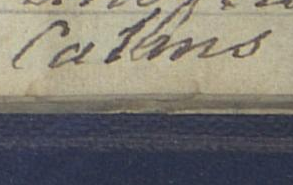Calams
